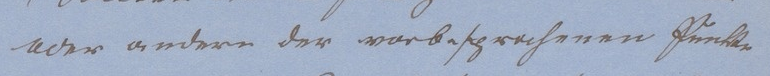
oder anderen der vorbesprochenen Punkte
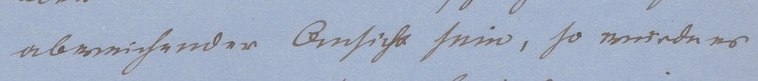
abweichender Ansicht sein, so würde es
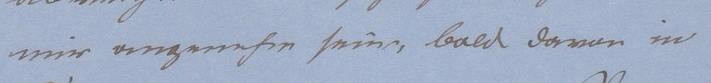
mir angenehm sein, bald davon in
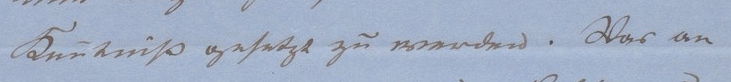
Kenntniß gesetzt zu werden. Was an
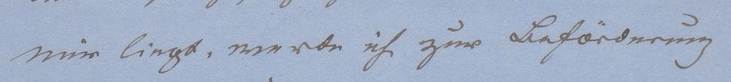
mir liegt, werde ich zur Beförderung
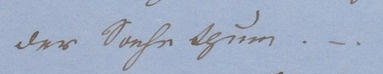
der Sache thun. – .
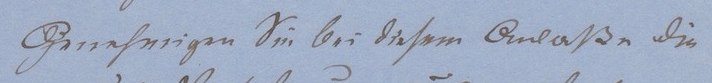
Genehmigen Sie bei diesem Anlaße die
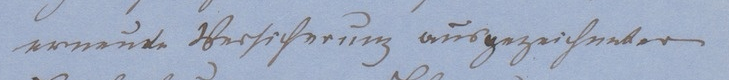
erneute Versicherung ausgezeichneter
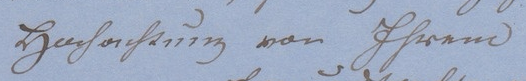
Hochachtung von Ihrem
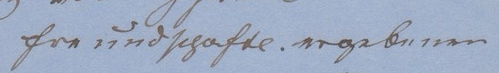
freundschaftl. ergebenen
